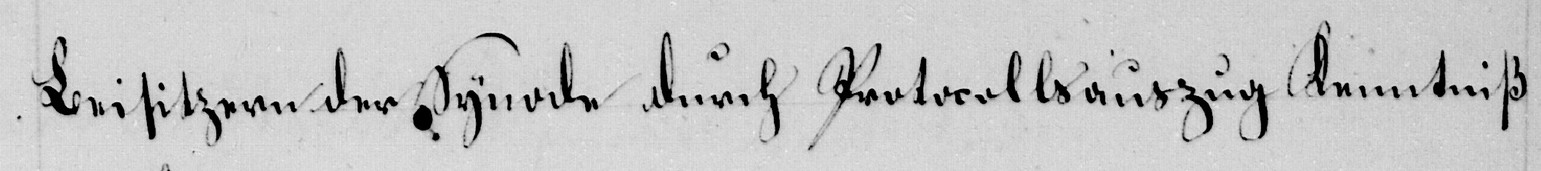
Beisitzern der Synode durch Protocollsauszug Kenntniß
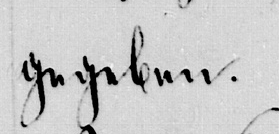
gegeben.
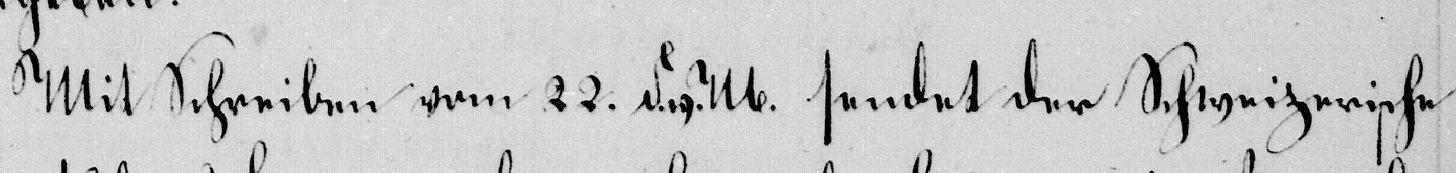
Mit Schreiben vom 22. d. v. M. sendet der Schweizerische
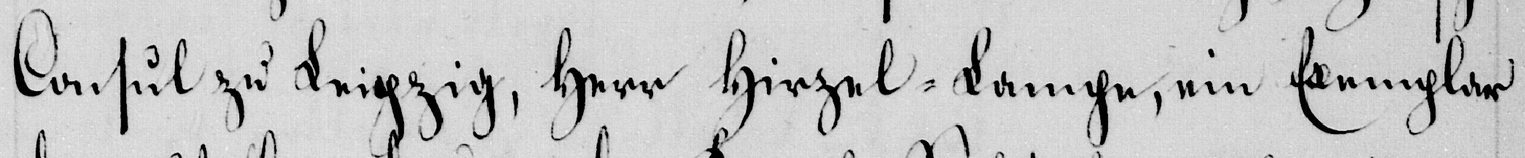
Consul zu Leipzig, Herr Hirzel-Lampe, ein Exemplar
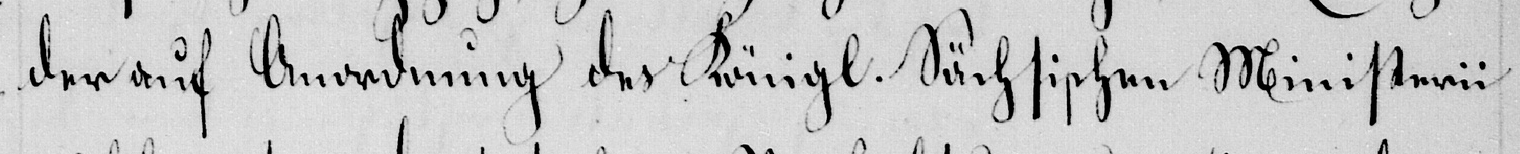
der auf Anordnung des Königl. Sächsischen Ministerii
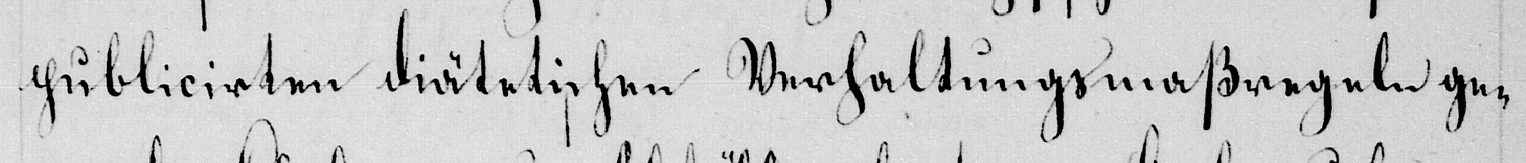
publicirten diätetischen Verhaltungsmaßregeln ge¬
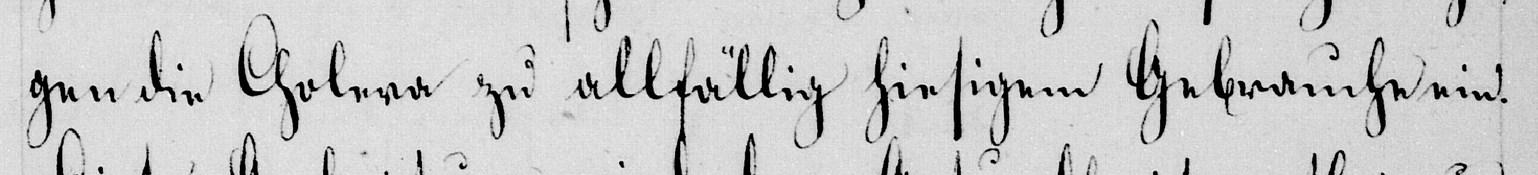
gen die Cholera zu allfällig hiesigem Gebrauche ein.
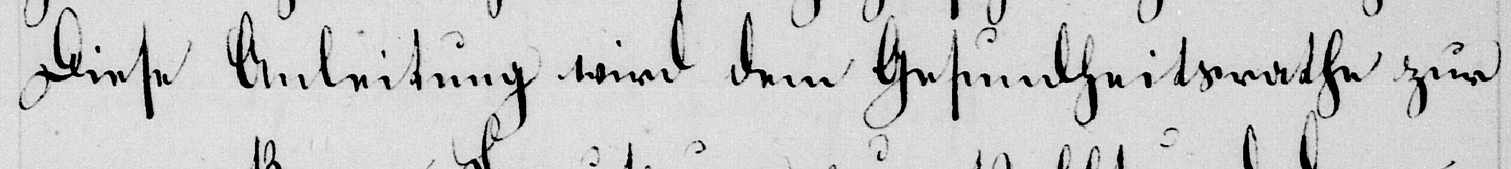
Diese Anleitung wird dem Gesundheitsrathe zur
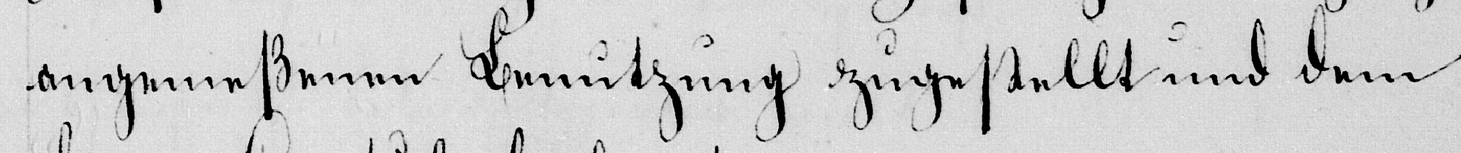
angemeßenen Benutzung zugestellt und dem
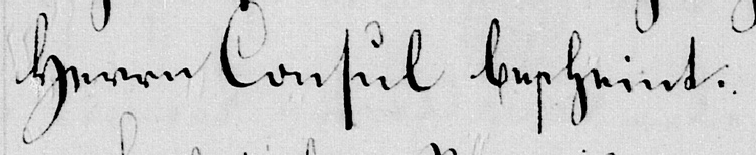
Herrn Consul bescheint.
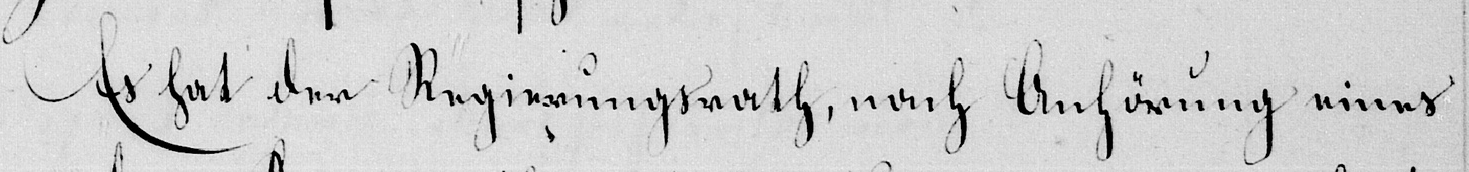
Es hat der Regierungsrath, nach Anhörung eines
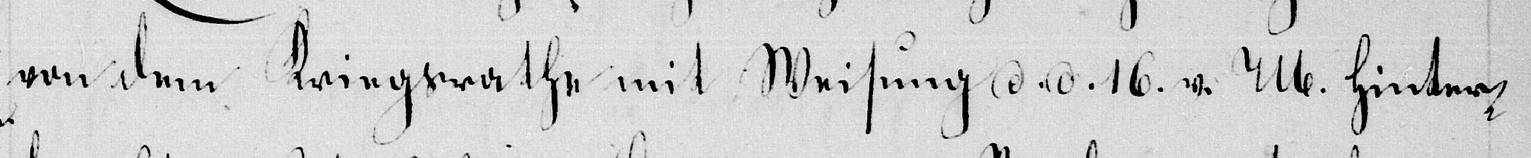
von dem Kriegsrathe mit Weisung d. d. 16. v. M. hinter¬
